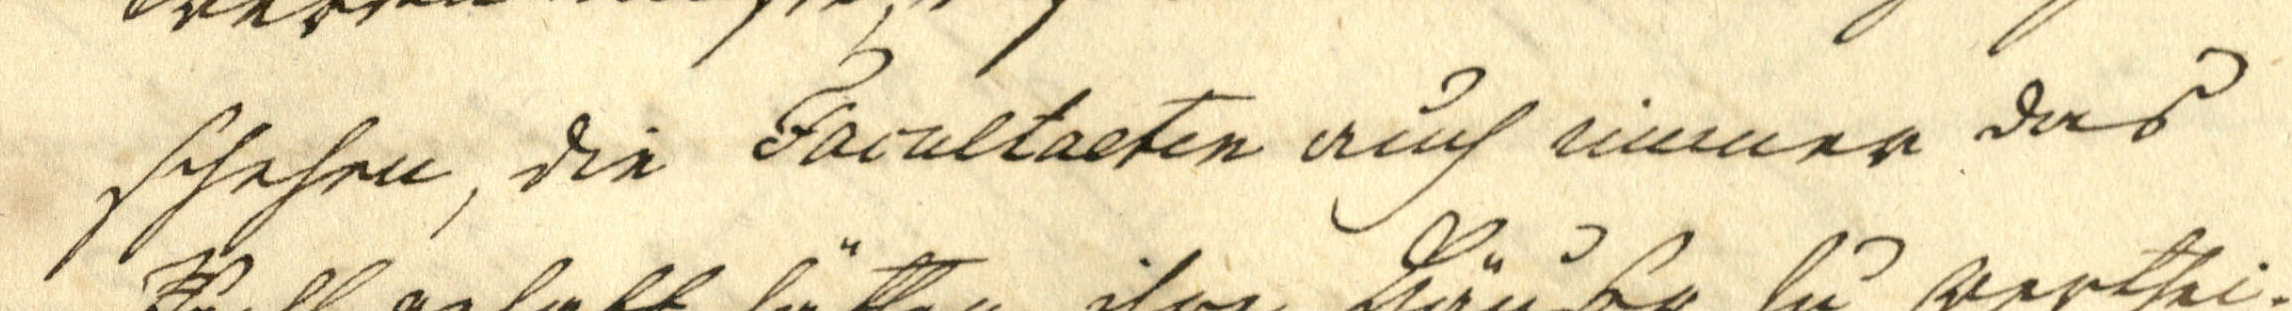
schehen, die Facultaeten auch immer das
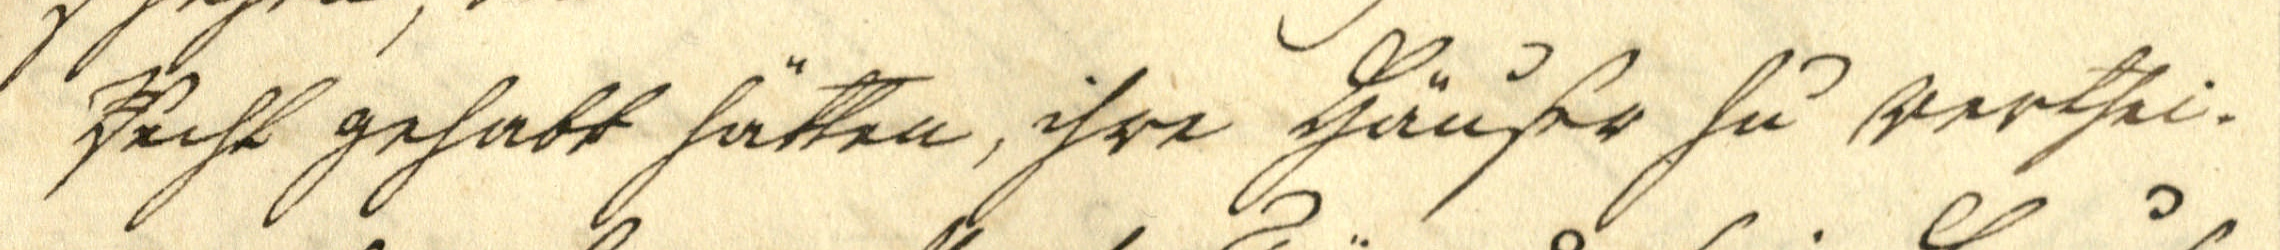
Recht gehabt hätten, ihre Häuser zu verthei¬
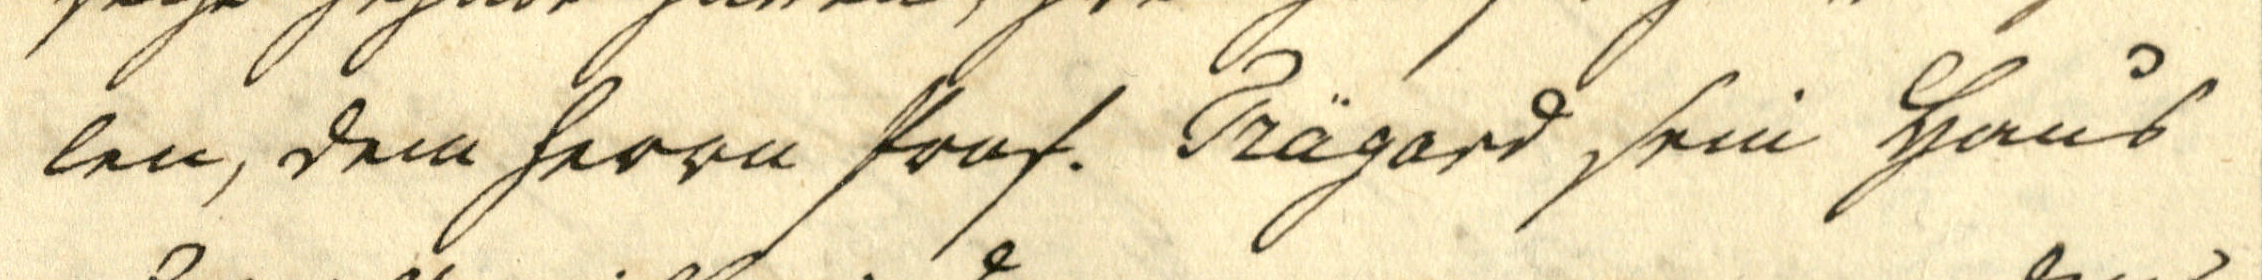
len, dem Herrn Prof. Trägård sein Haus
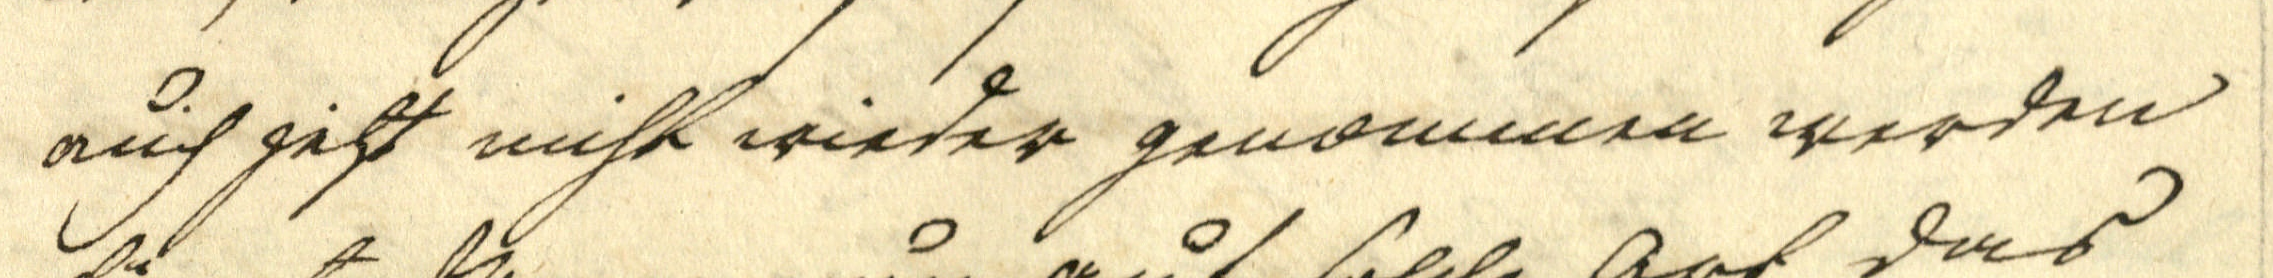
auch jetzt nicht wieder genommen werden
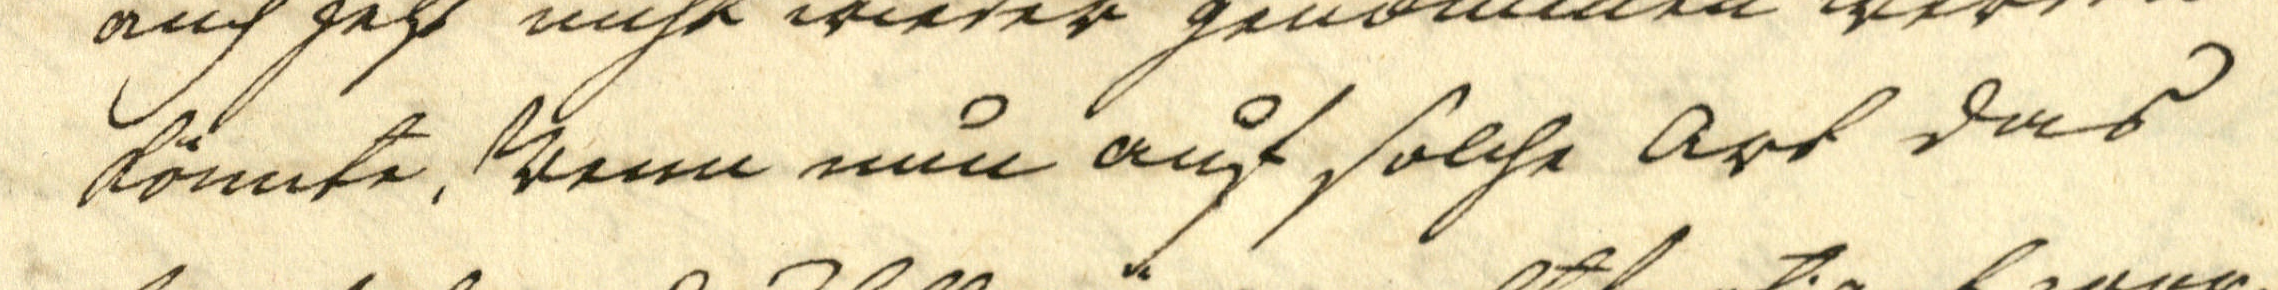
könnte. Wenn nun auf solche Art das
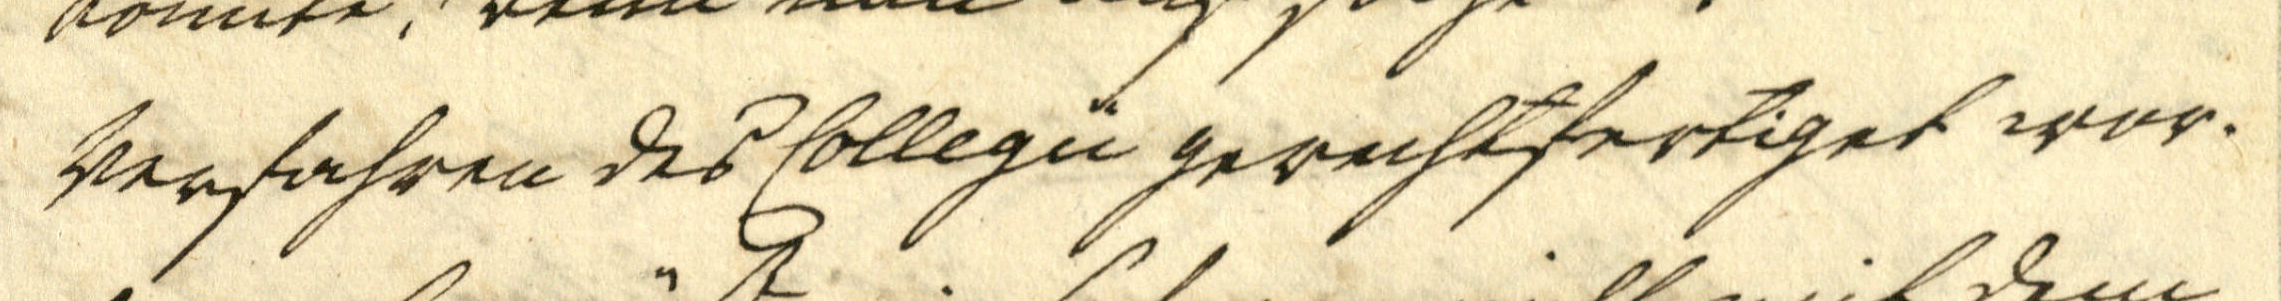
Verfahren des Collegii gerechtfertiget wor¬
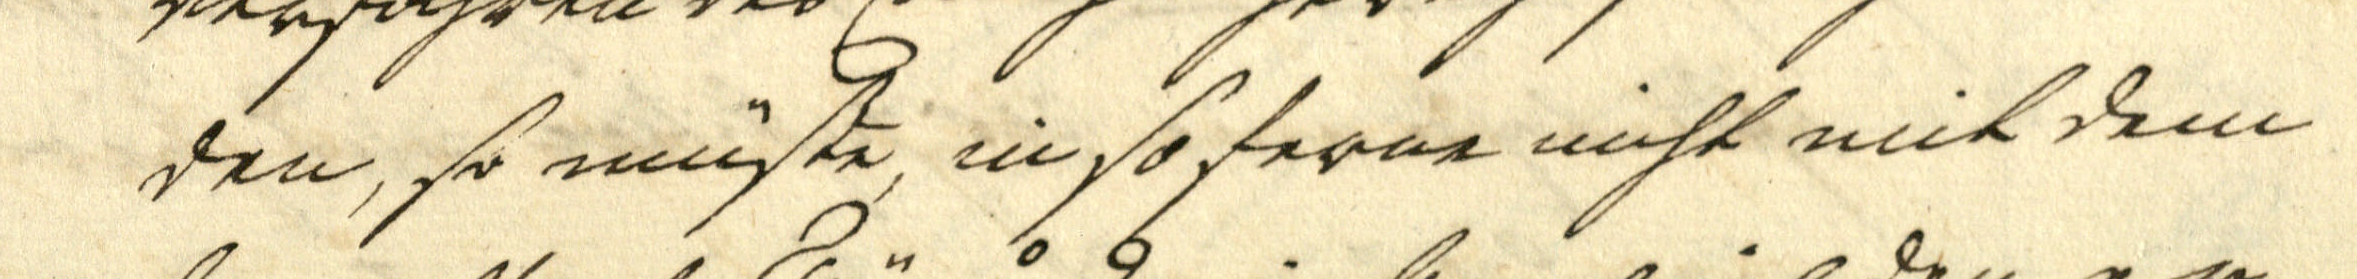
den, so müßte, in so ferne nicht mit dem
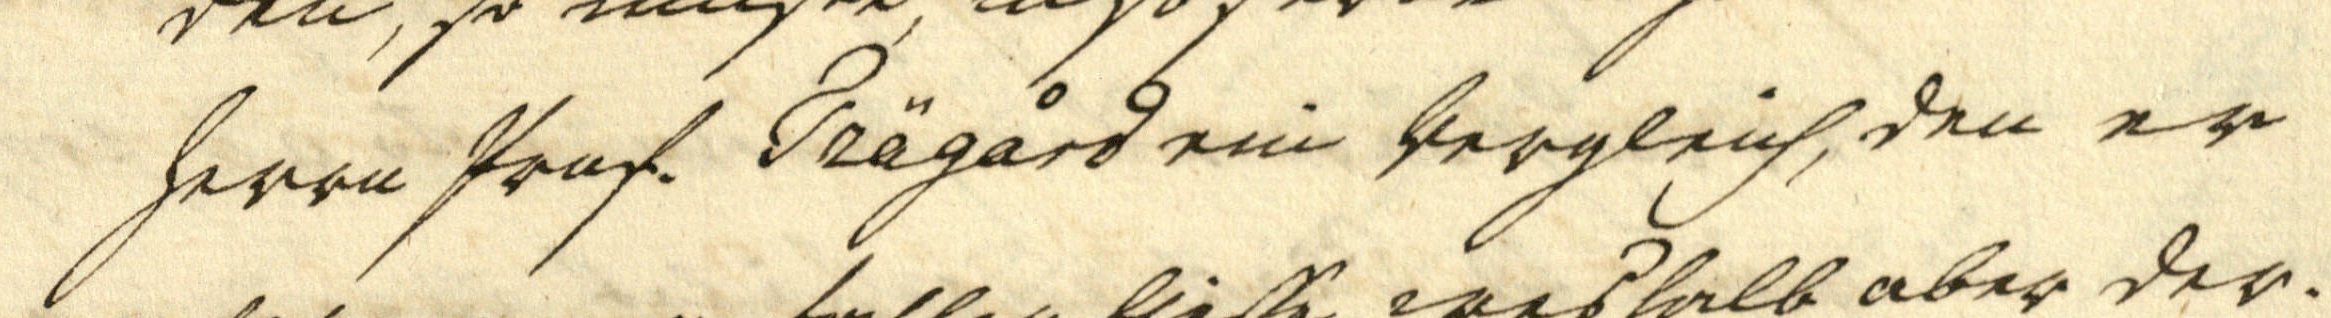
Herrn Prof. Trägård ein Vergleich, den er
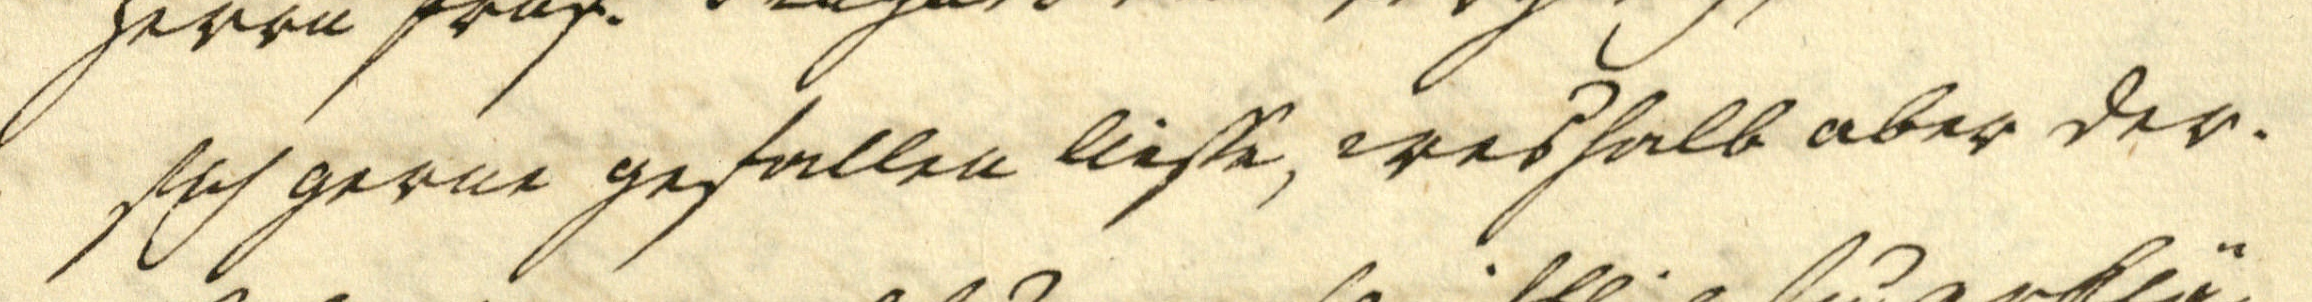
sich gerne gefallen liesse, weshalb aber der¬
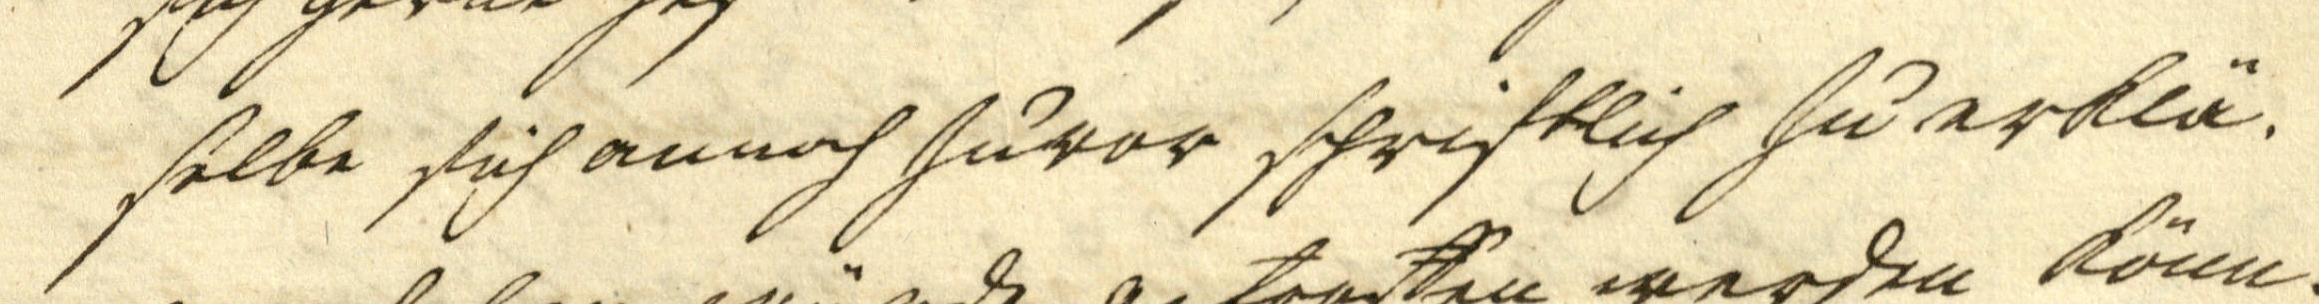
selbe sich annoch zuvor schriftlich zu erklä¬
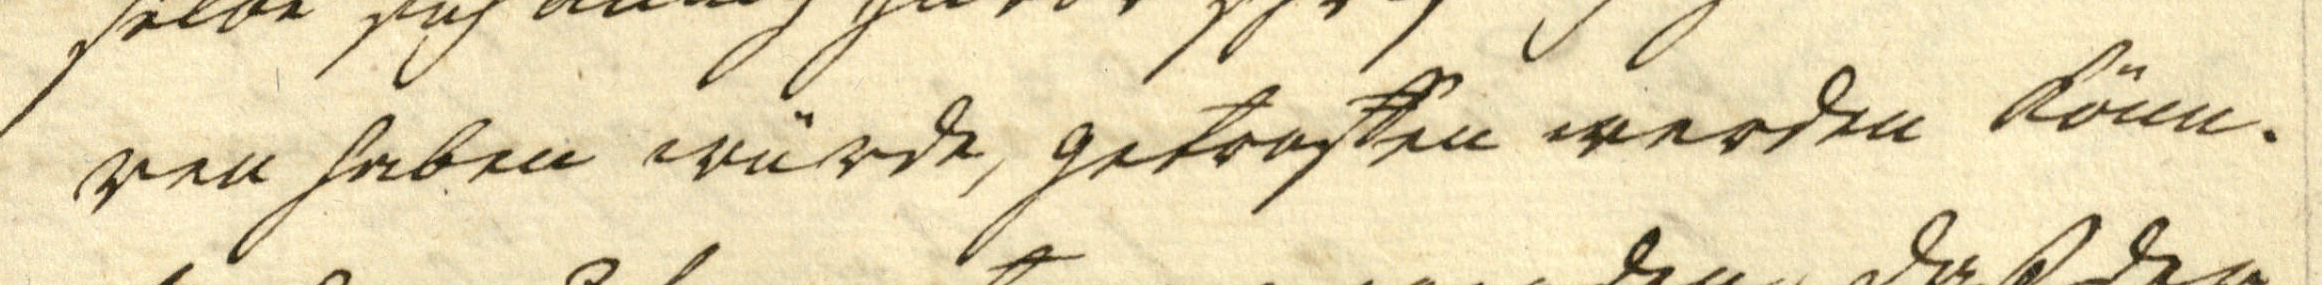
ren haben würde, getroffen werden könn¬
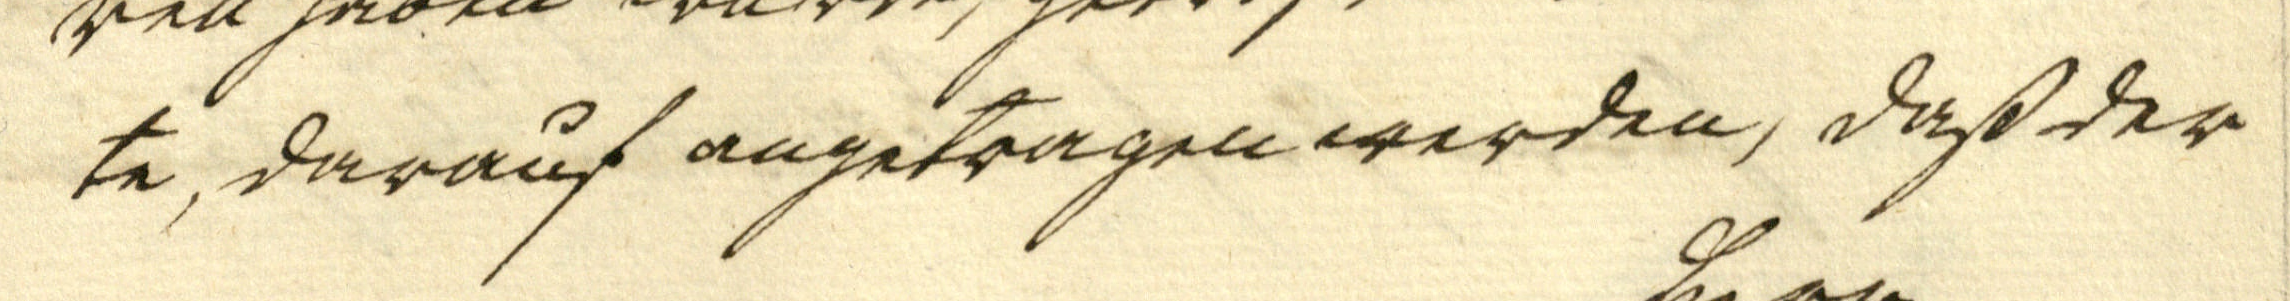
te, darauf angetragen werden, daß der
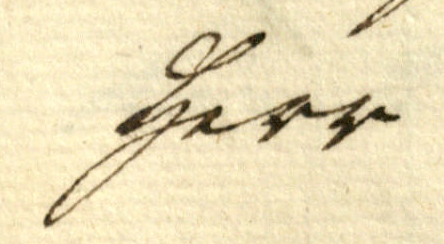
Herr
